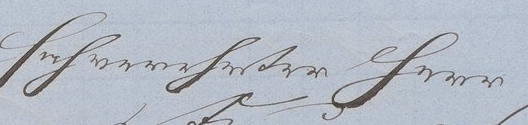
Hochverehrter Herr
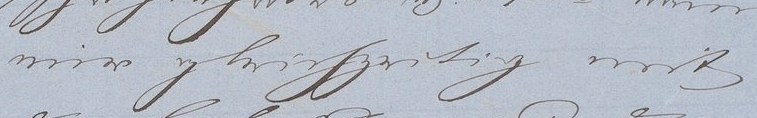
mir gleichzeitig mit
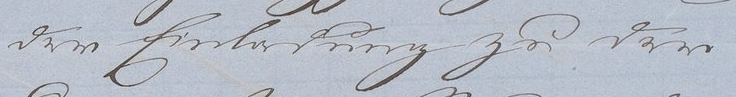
der Einladung zu der
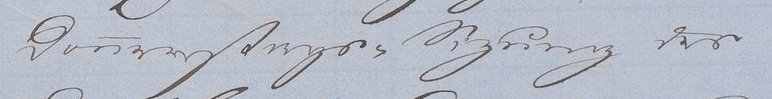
Donnerstags-Sizung des
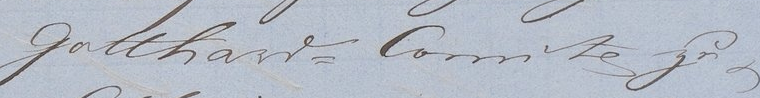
Gotthard-Comite zu &
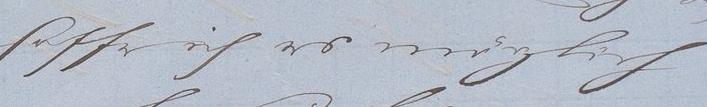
hoffe ich es möglich
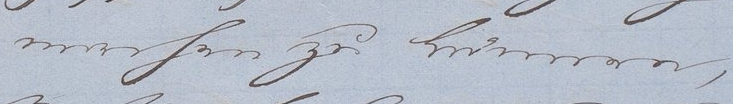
machen zu können,
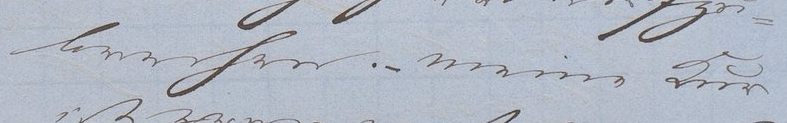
brechen. – Meine Kur
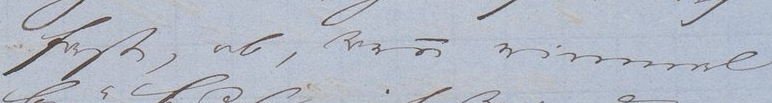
fast, ob, wenn einmal
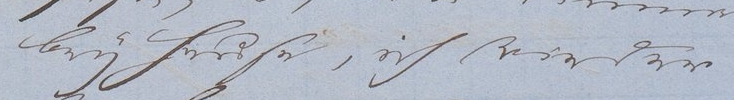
bey Hause, ich wieder
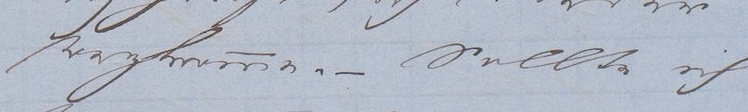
wegkomme. – Sollte ich
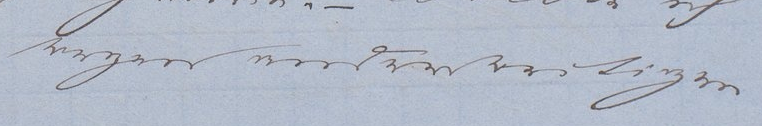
wegen anderweitigen
